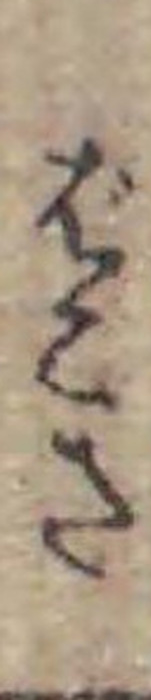ばこた

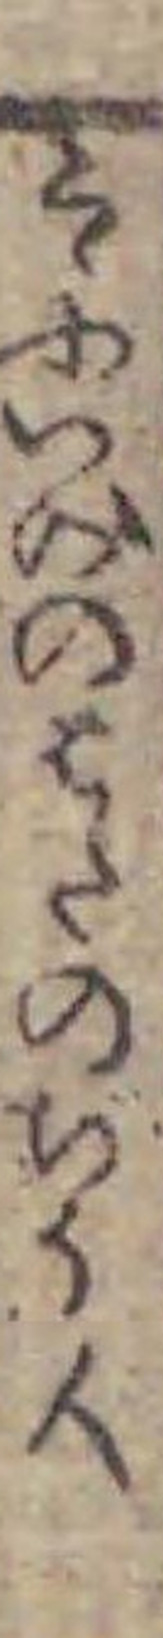こゝにいけのはたのぢう人
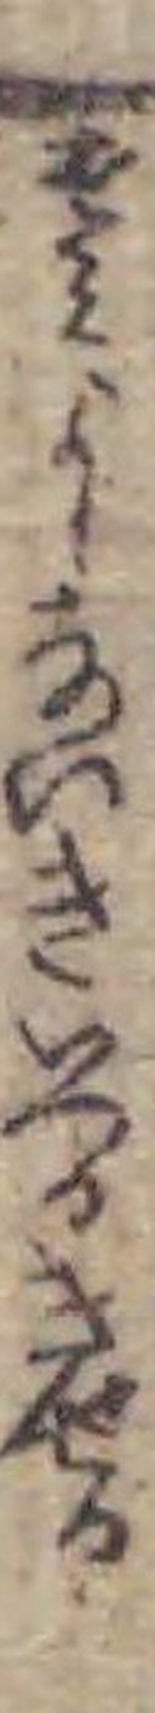すみよしないきいへるきせる
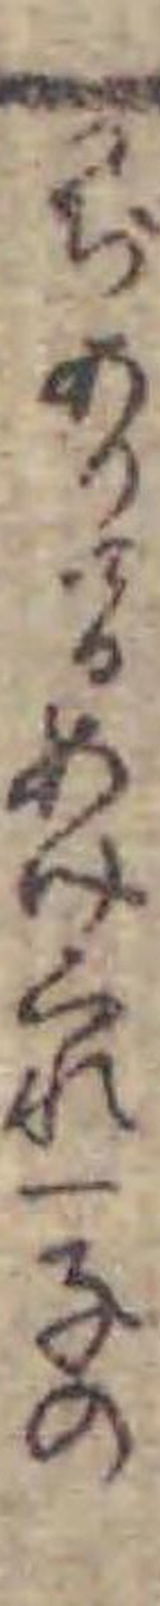かぢありけるあけくれ一子の
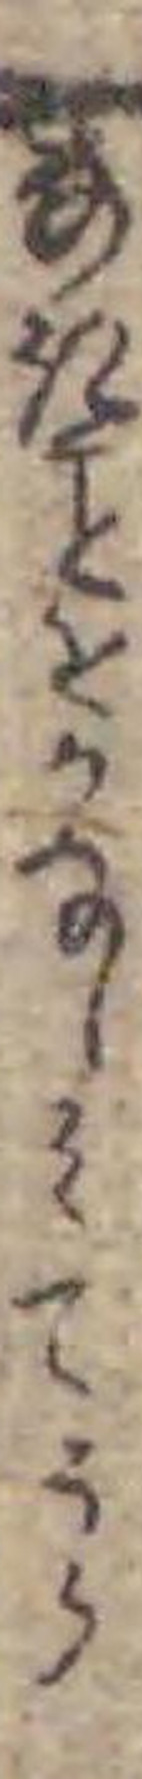なきことをかなしみてうら
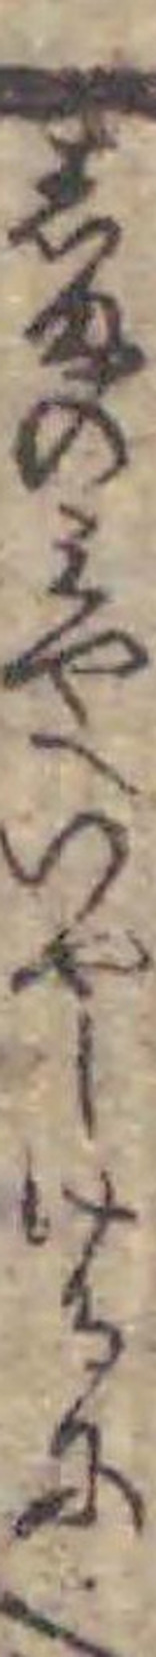しまのみやへいやしけるに
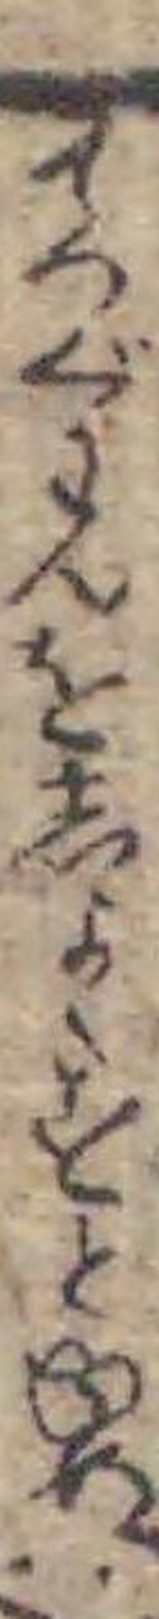てつぐわんをしよくすとゆめ
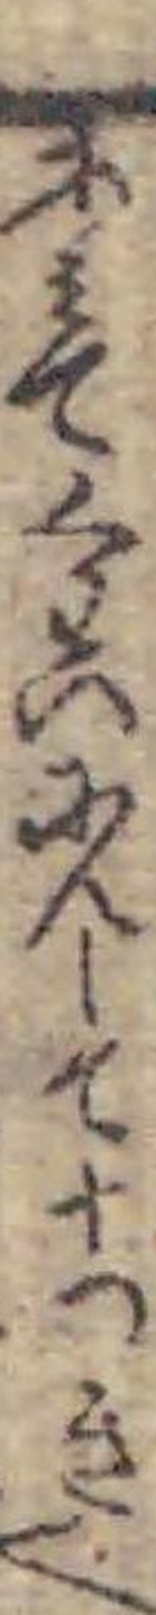にみてくわいにんして十つき
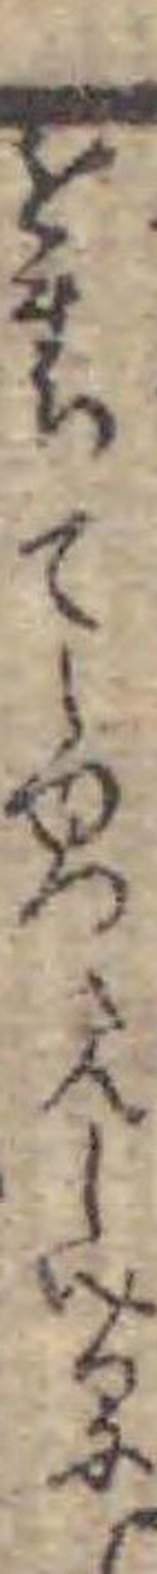をまちてしゆつさんしけるに
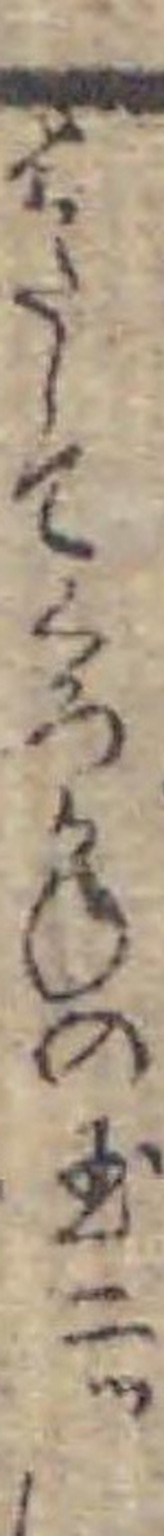はたしてくろかねの玉二つ
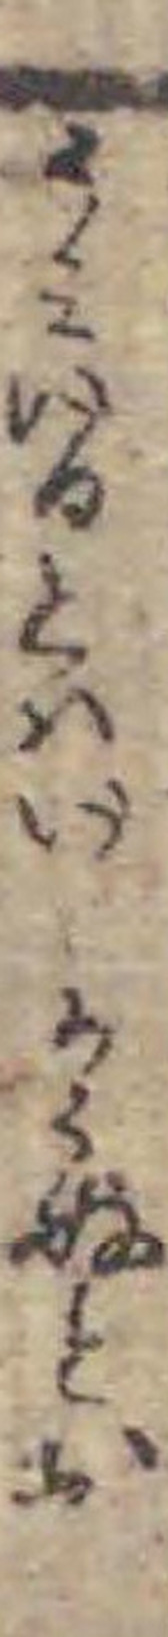うみけるとはけしからぬとお
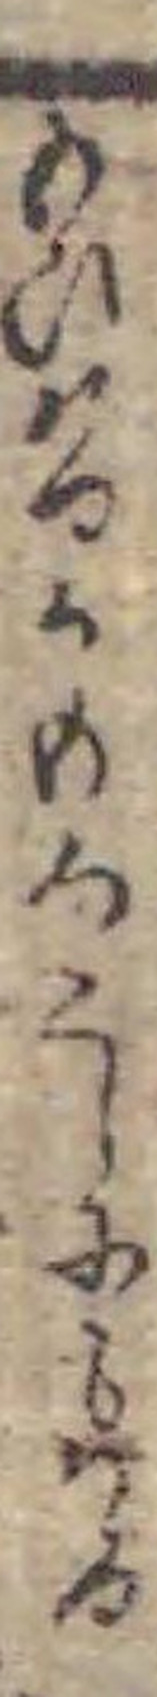もひけるかもろこしにもかゝる
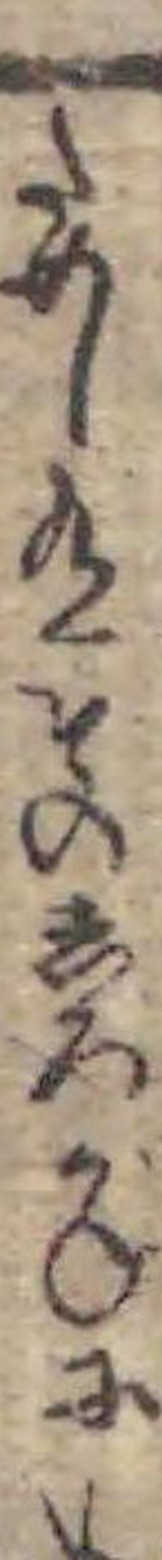ためし有そのしろがねに
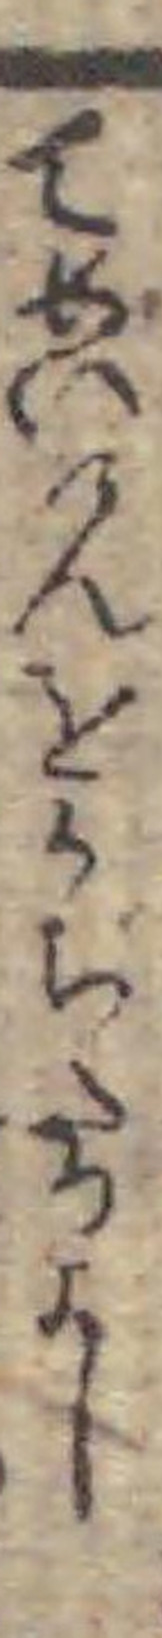てめいけんをうちたるよし
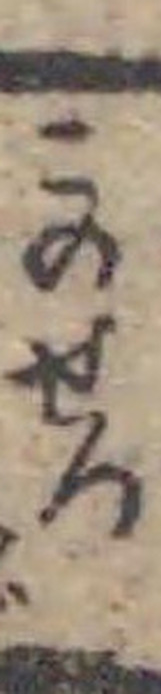このせつ
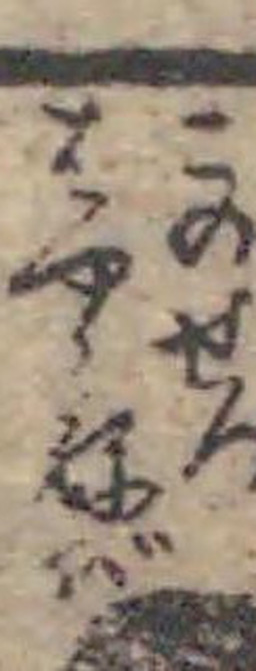はやらねば
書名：威気千代牟物語 : 2巻
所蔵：国立国会図書館 National Diet Library, JAPAN
